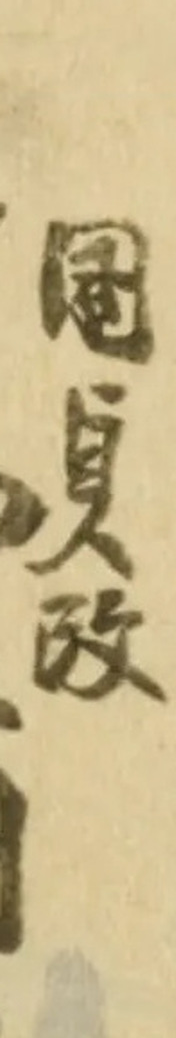国貞改
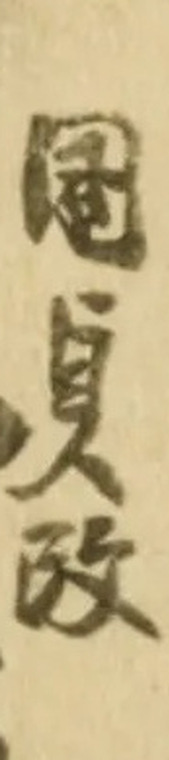国貞改
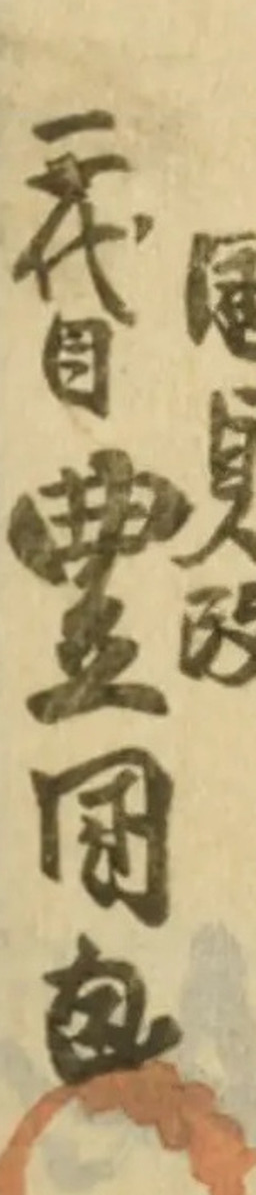二代目豊国画
